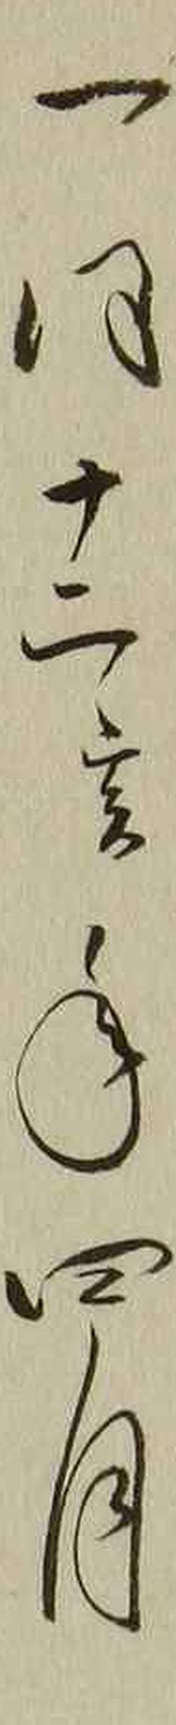一同十二亥年四月
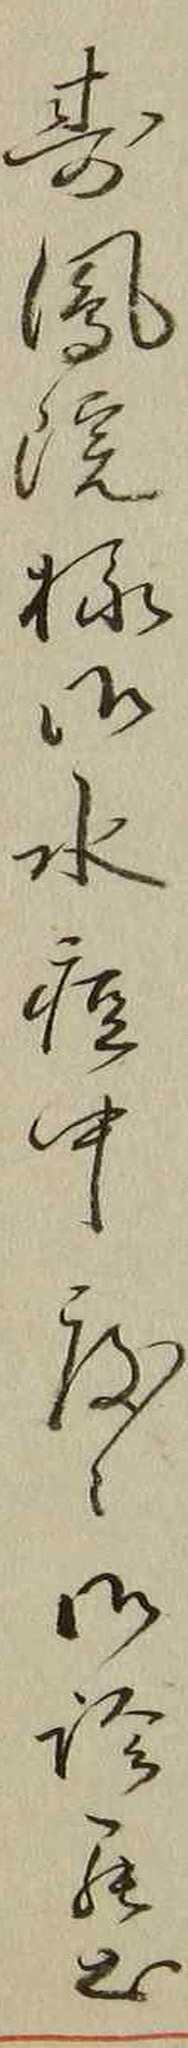寿鳳院様御水痘中度々御診罷出
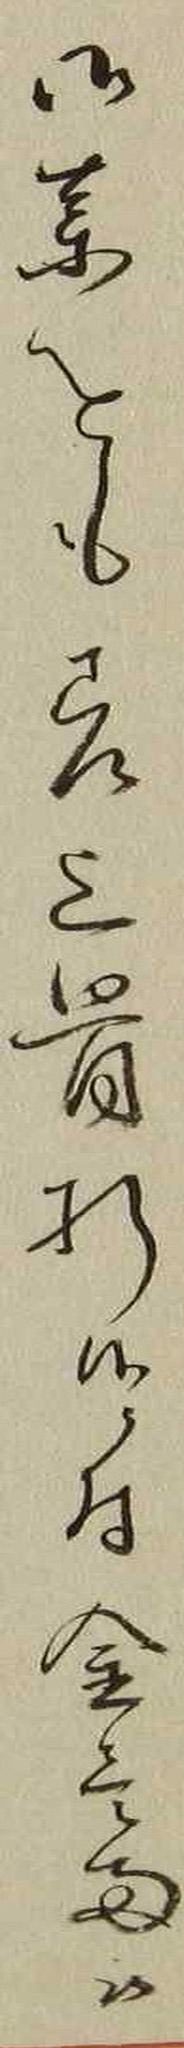御薬をも差上骨折候ニ付金壱両被
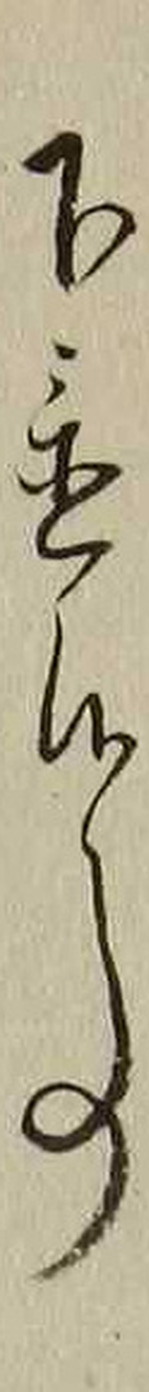下置候事
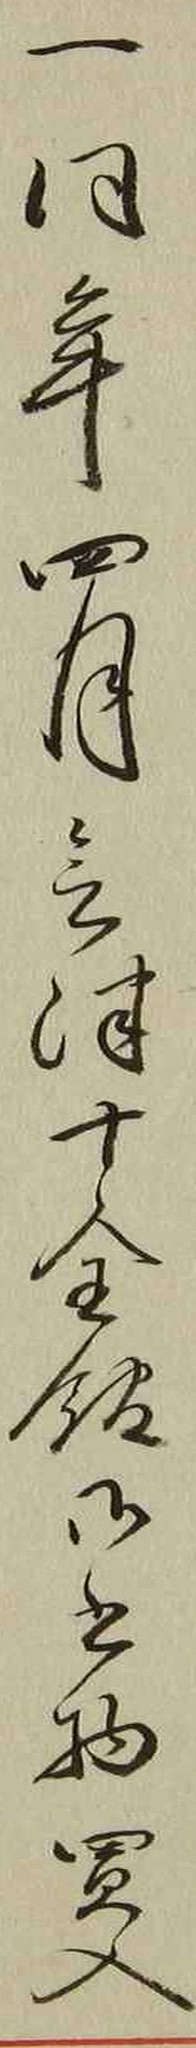一同年四月会津十全館御書物買入
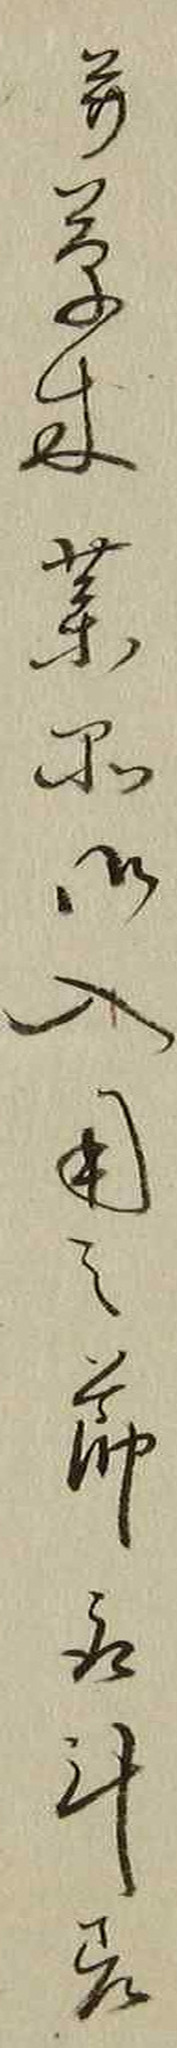并草木薬品御入用之節取計差
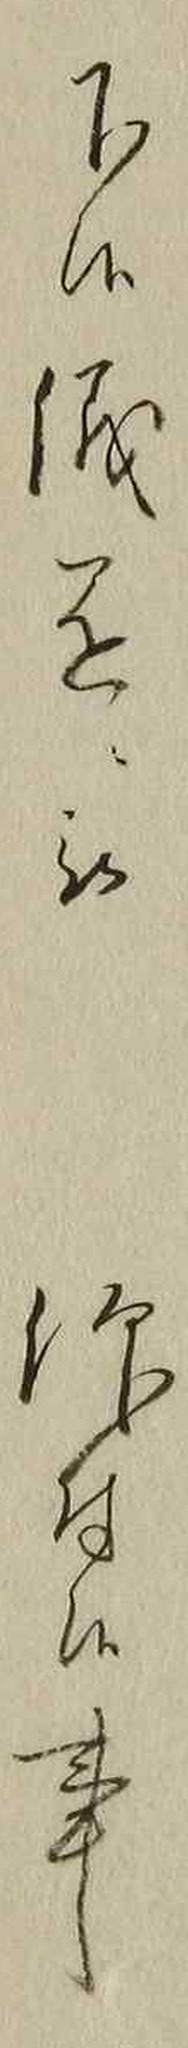下候儀懸ニ被仰付候事
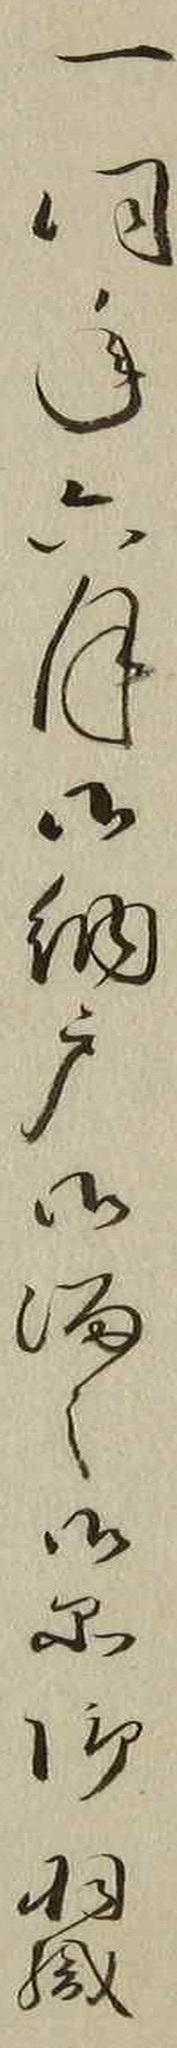一同年六月御納戸御溜之御品御羽織
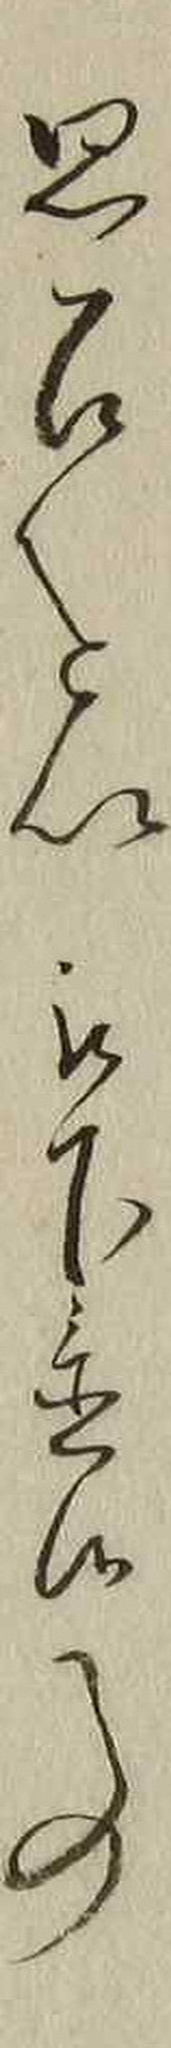思召を以被下置候事
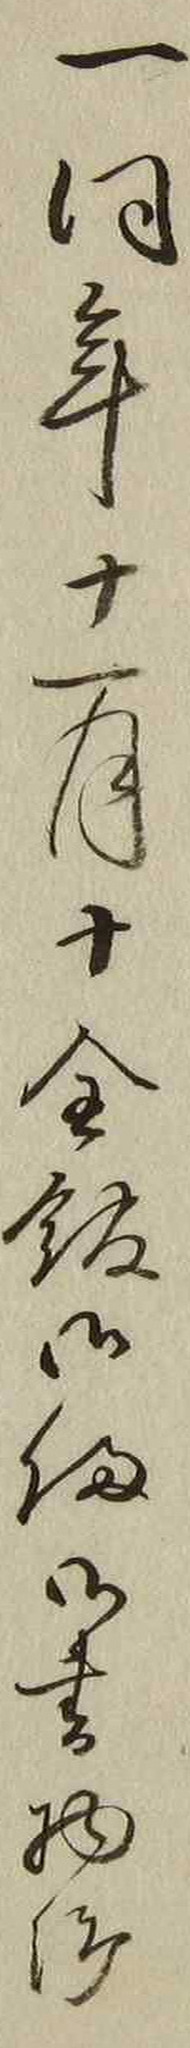一同年十一月十全館御備御書物御
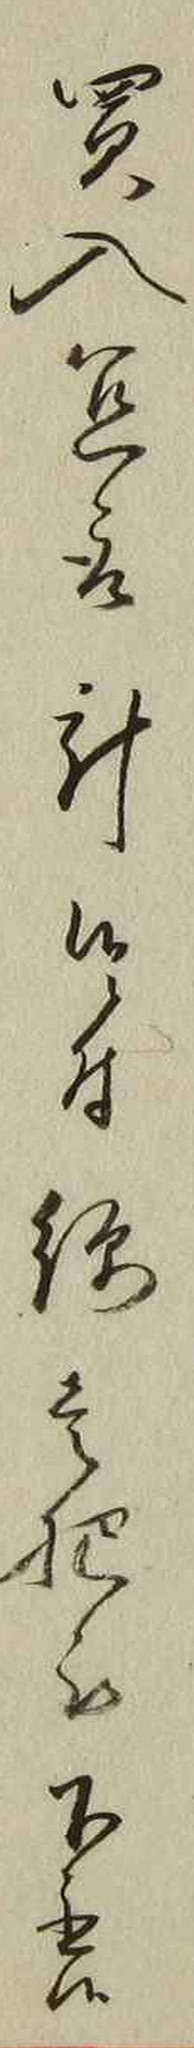買入宜取計候ニ付綿壱把被下置候
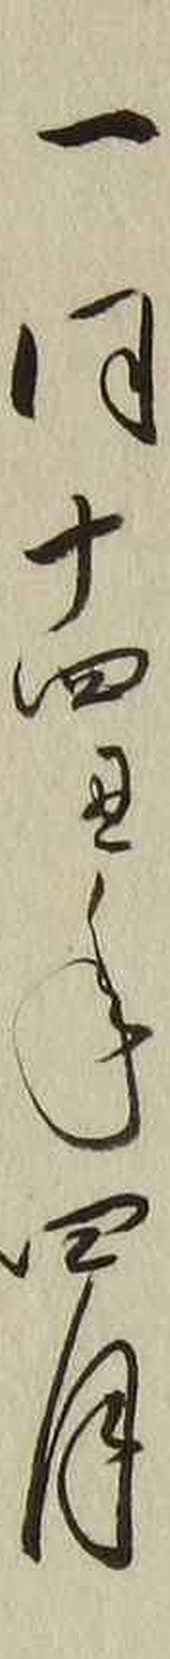一同十四丑年四月
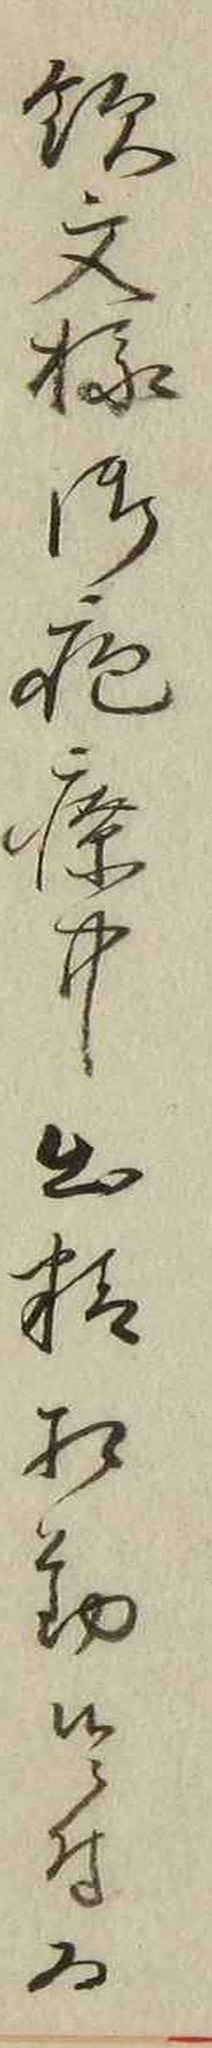欽文様御疱療中出精相勤候ニ付為
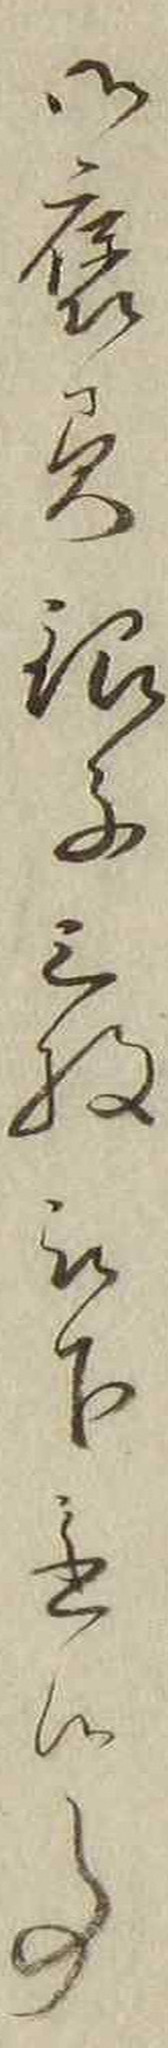御褒美銀子三枚被下置候事
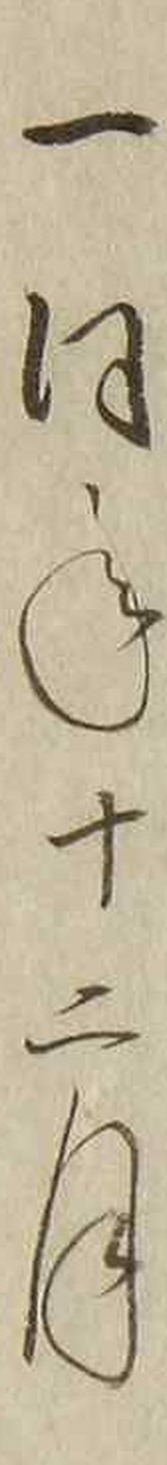一同年十二月

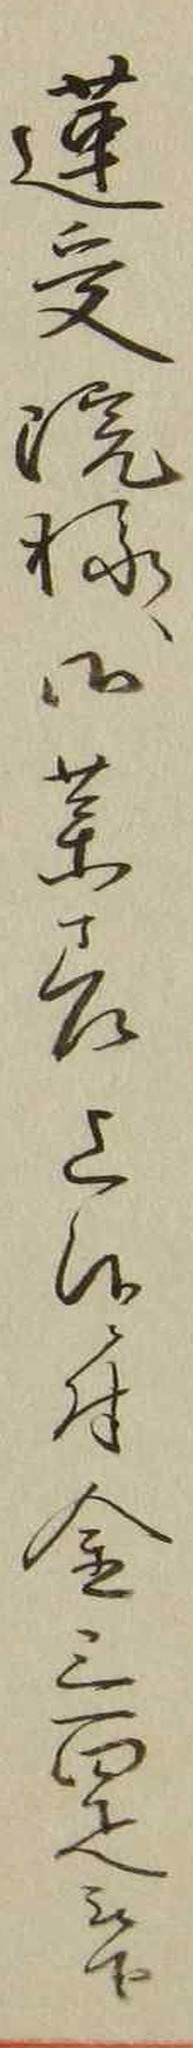蓮受院様御薬差上候ニ付金三百疋被下
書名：諸士系譜　巻之8　い之部8
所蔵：会津若松市立会津図書館
